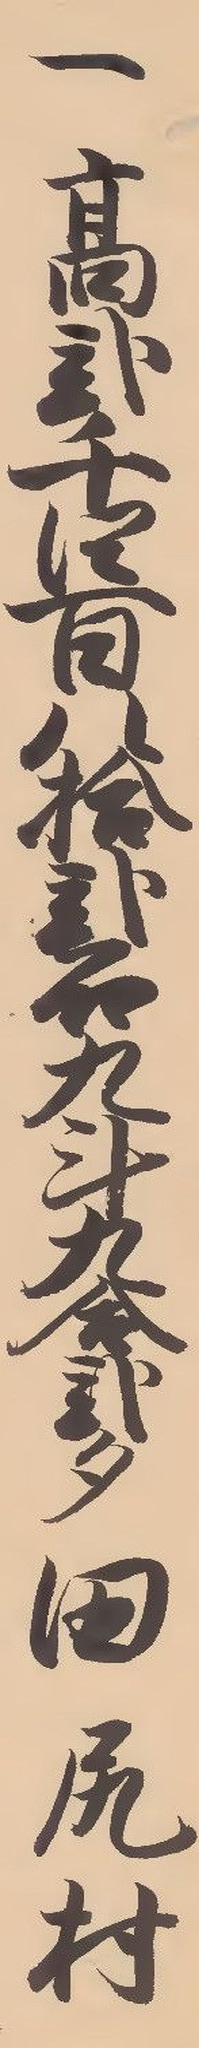一高弐千四百八拾弐石九斗九合弐勺田尻村
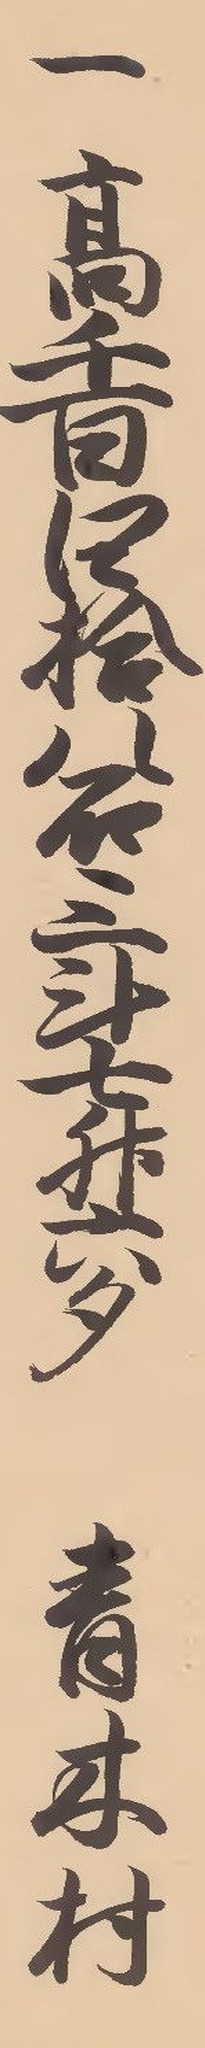一高千百四拾八石三斗七升六勺青木村
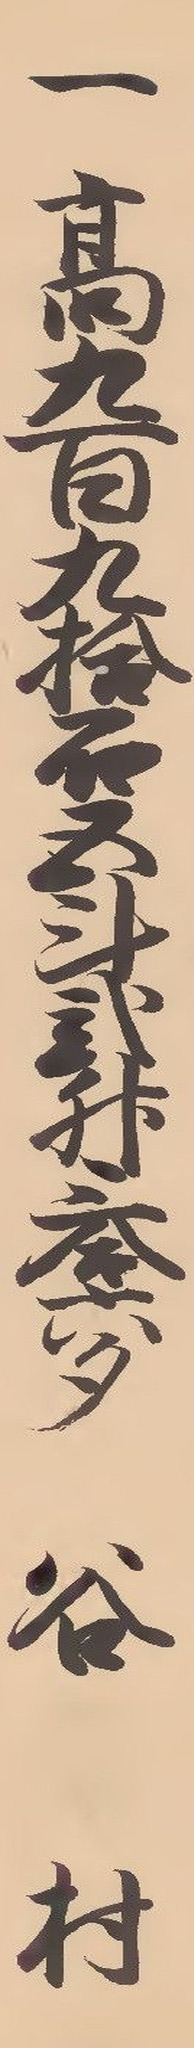一高九百九拾石五斗弐升三合六勺谷村
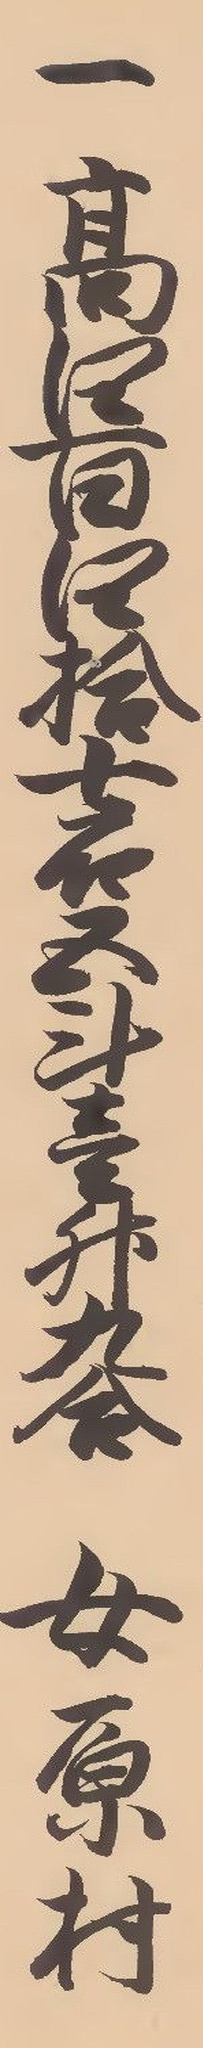一高四百四拾七石五斗壱升九合女原村
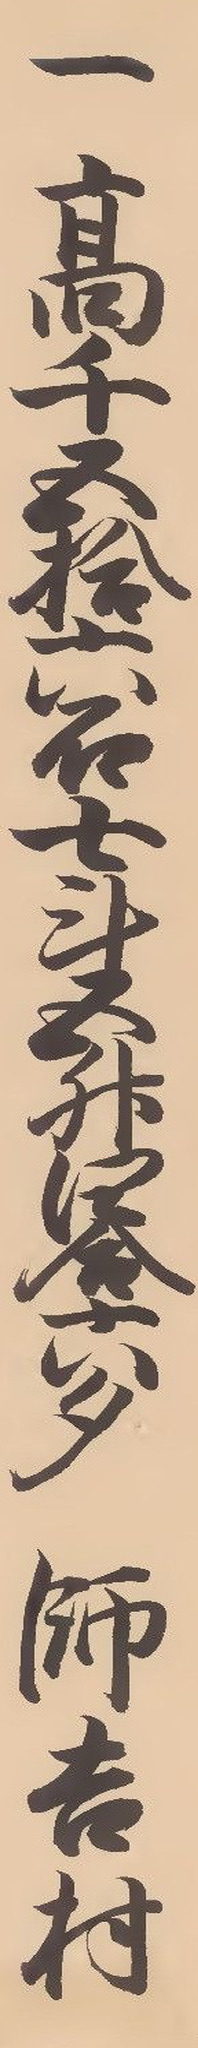一高千五拾六石七斗五升四合六勺師吉村
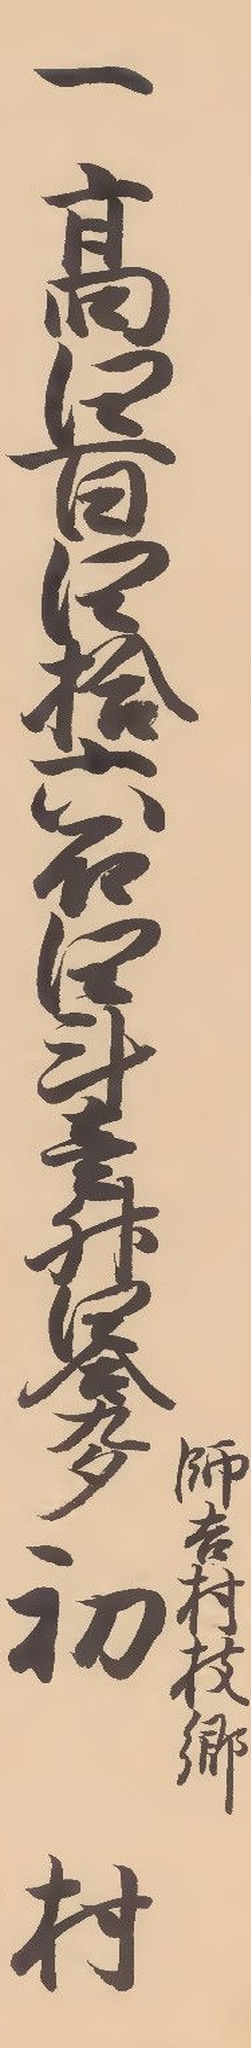一高四百四拾七石五斗壱升九合女原村

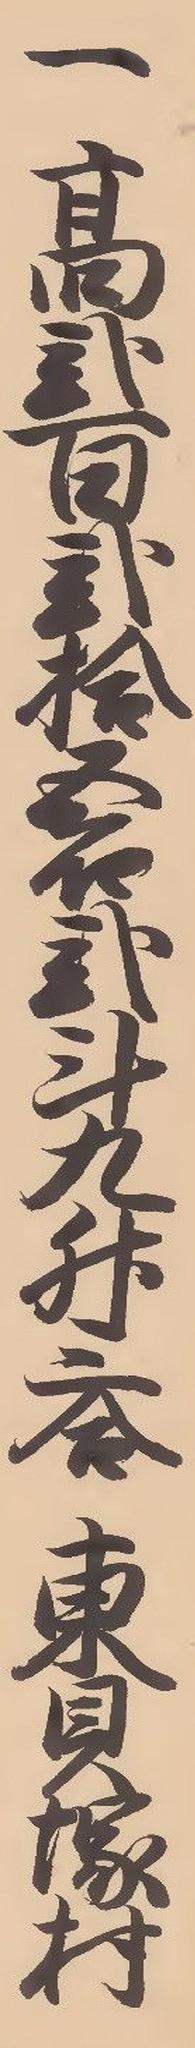一高弐百弐拾五石弐斗九升三合東貝塚村
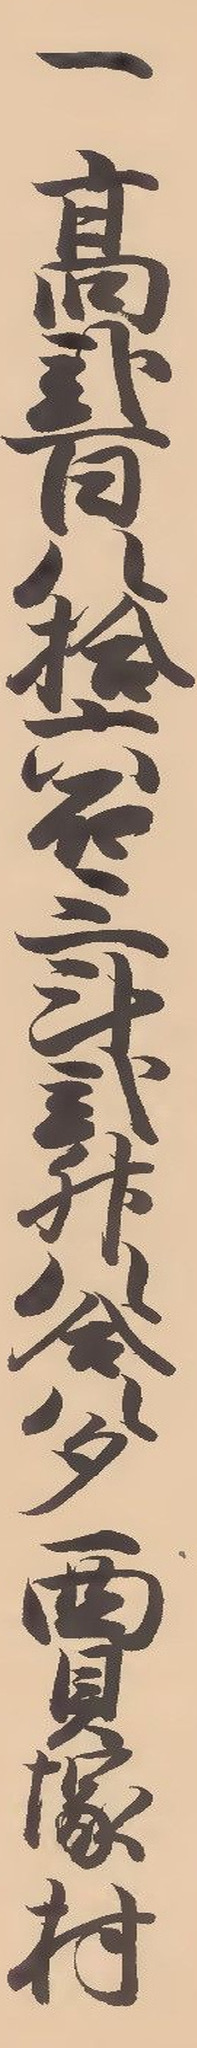一高弐百八拾六石三斗弐升八合八勺西貝塚村
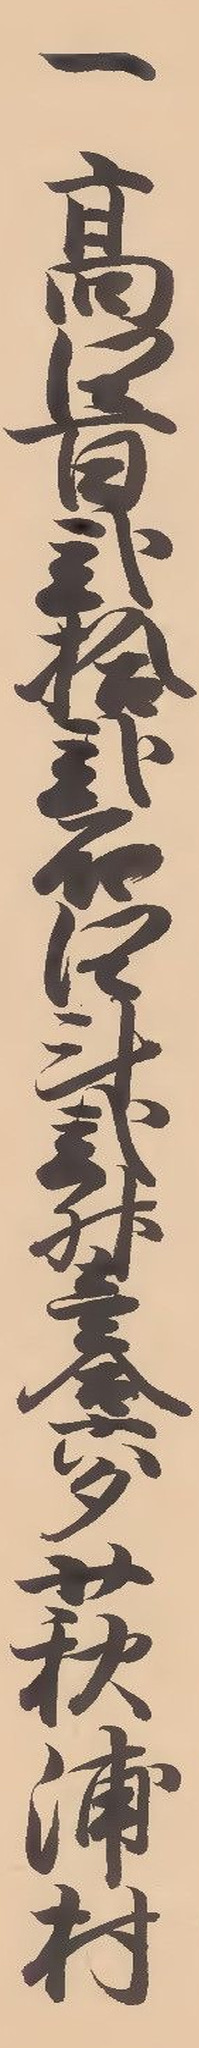一高四百弐拾弐石四斗弐升壱合六勺萩浦村
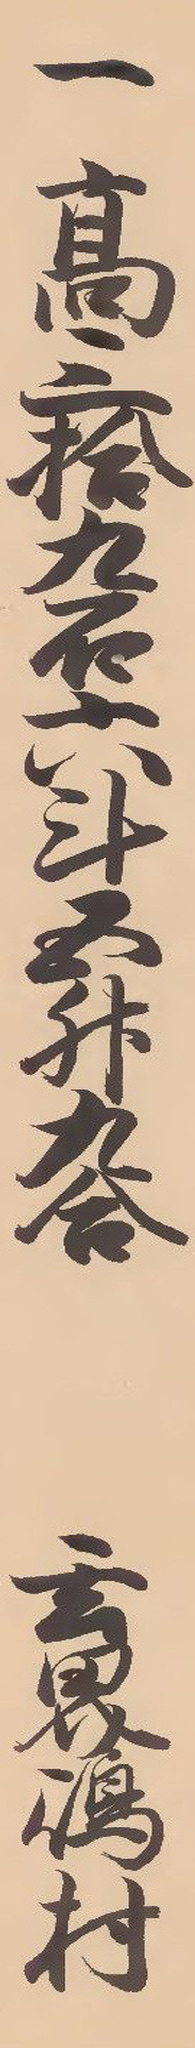一高三拾九石六斗五升九合玄界島村
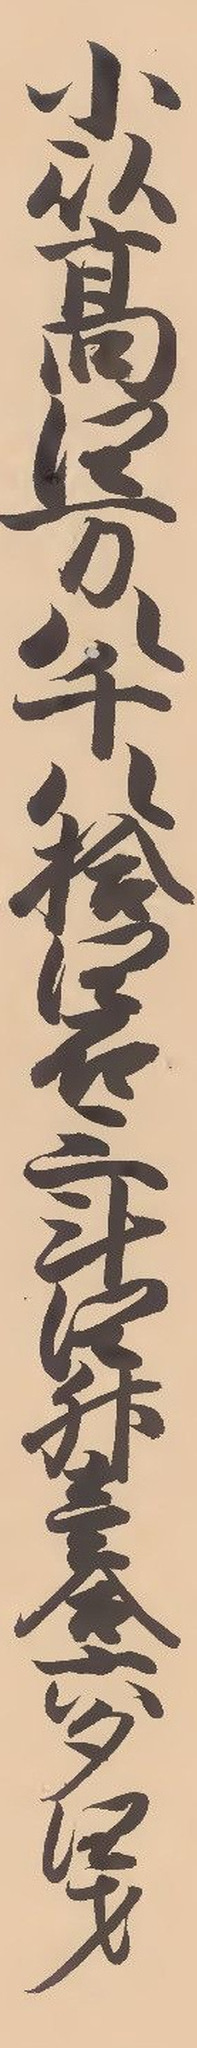小以高四万八千八拾四石三斗四升壱合六勺四才

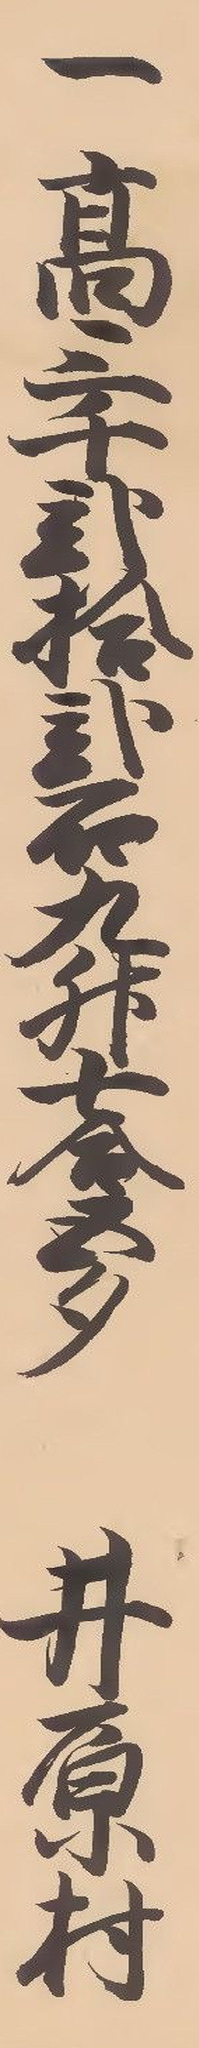一高三千弐拾弐石九升七合五勺井原村
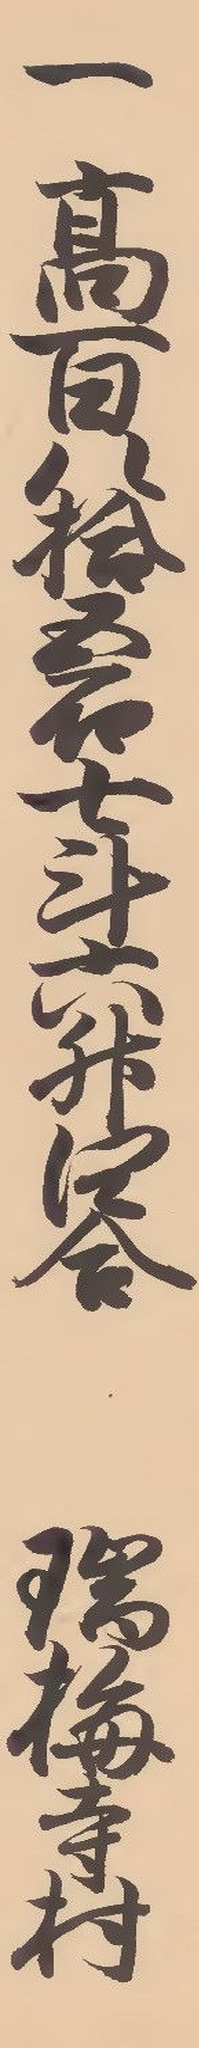一高百八拾五石七斗六升四合瑞梅寺村
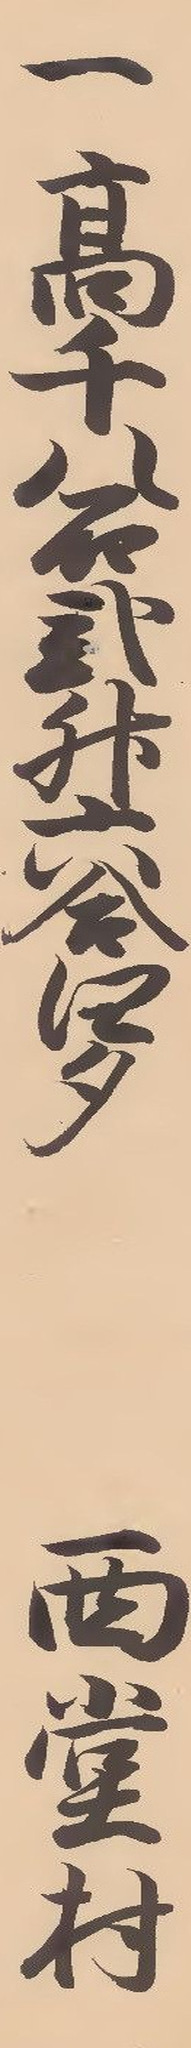一高千八石弐升六合四勺西堂村
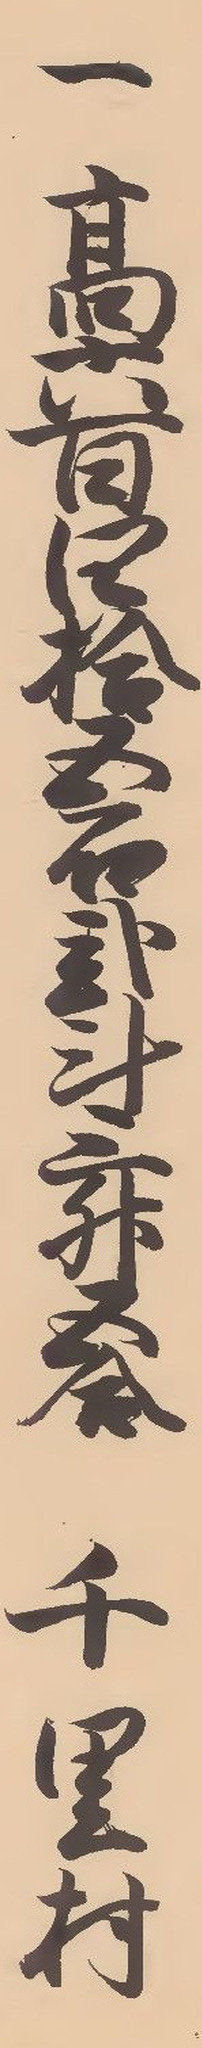一高六百四拾五石弐斗三升五合千里村
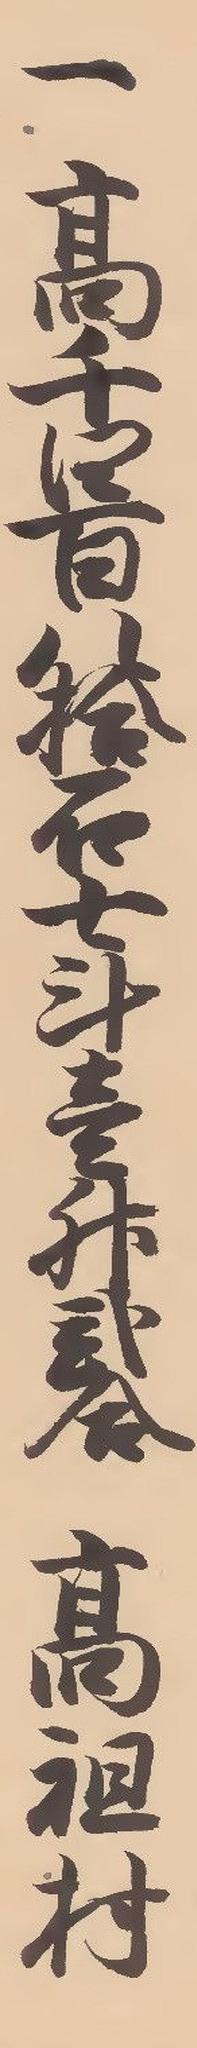一高千四百八拾石七斗壱升弐合高祖村
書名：筑前国郷帳
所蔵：国立公文書館 National Archives of Japan
